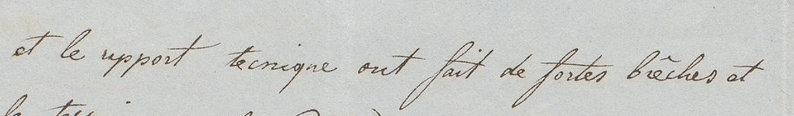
et le rapport tecnique ont fait de fortes brêches et
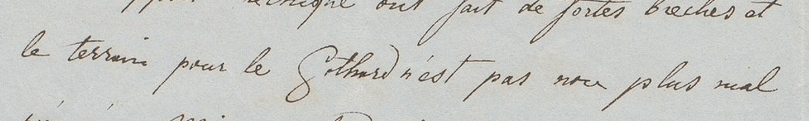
le terrain pour le Gothard n'est pas non plus mal
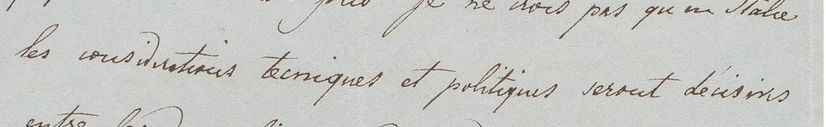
les considerations tecniques et politiques seront décisives
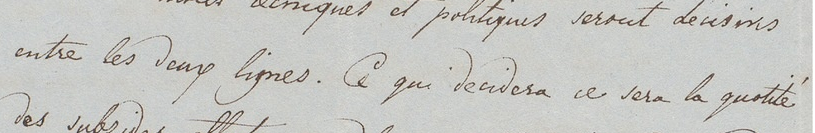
entre les deux lignes. Ce qui decidera ce sera la qualité
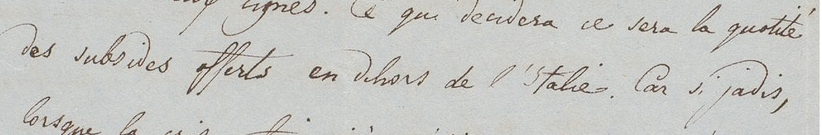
des subsides offerts en dehors de l'Italie. Car si jadis,
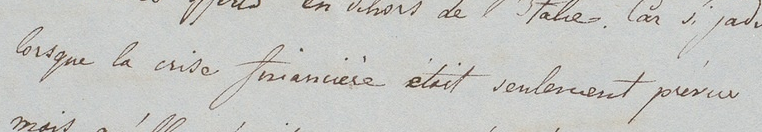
lorsque la crise financière était seulement prévue
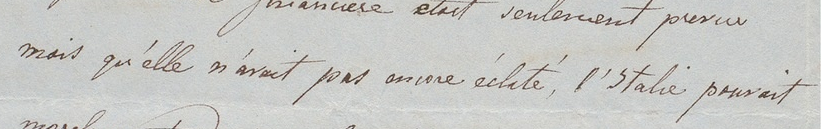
mais qu'elle n'avait pas encore éclaté, l'Italie pouvait
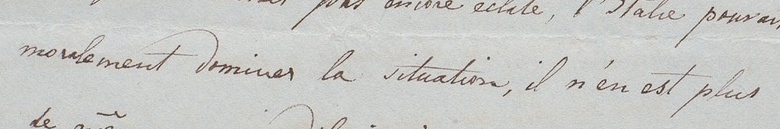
moralement dominer la situation, il n'en est plus
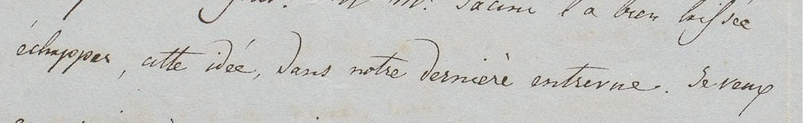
échapper, cette idée, dans notre dernière entrevue. Je veux
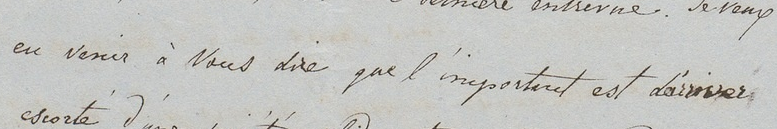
en venir à Vous dire que l'important est d'arriver
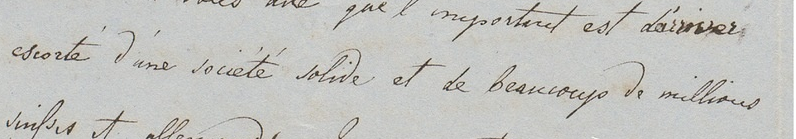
escorté d'une société solide et de beaucoup de millions
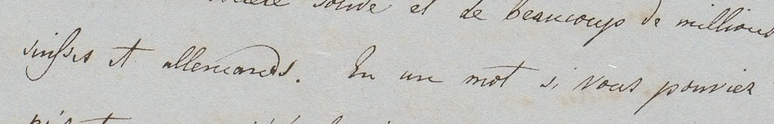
suisses et allemands. En un mot si Vous pouviez
